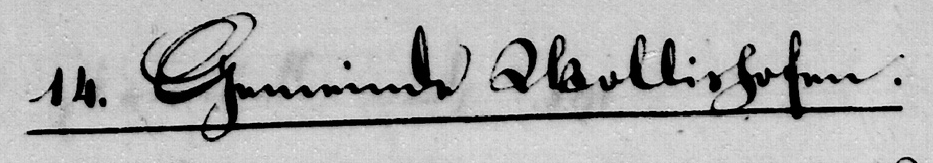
14. Gemeinde Wollishofen.
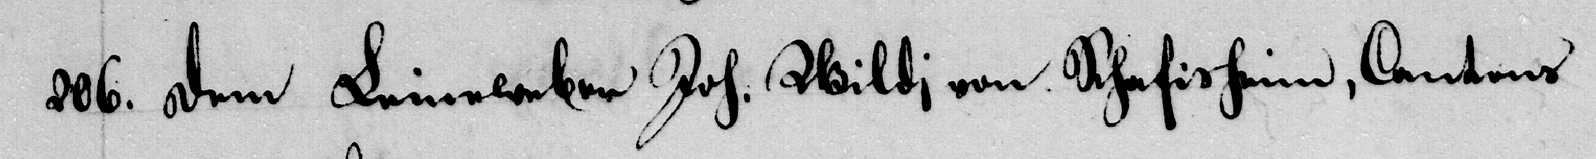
206.) Dem Leineweber Joh. Wildi von Schafisheim, Cantons
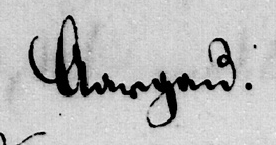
Aargau.
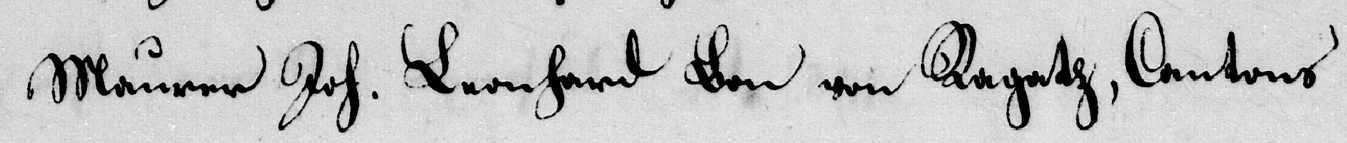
Maurer Joh. Leonhard Bon von Ragatz, Cantons
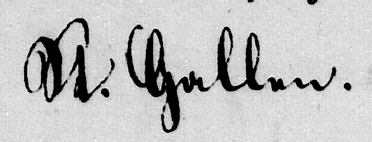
St. Gallen.
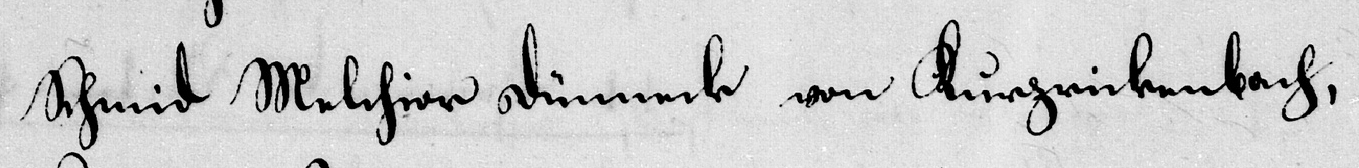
Schmid Melchior Dünneck Kurzrickenbach,
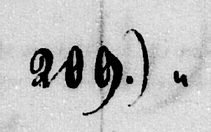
209.) “
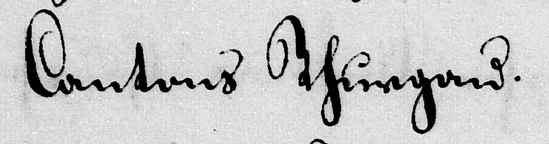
Cantons Thurgau.
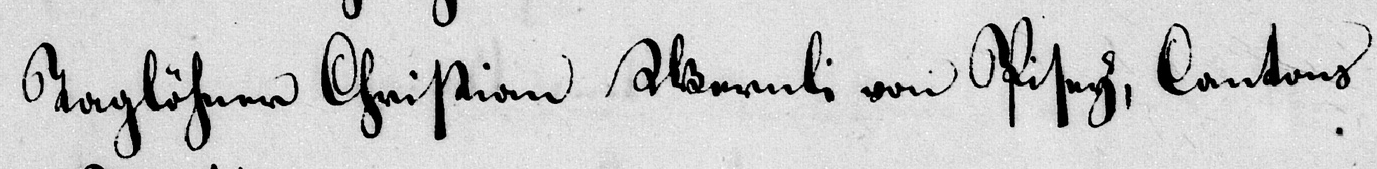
Taglöhner Christian Wernli von Pisey, Cantons
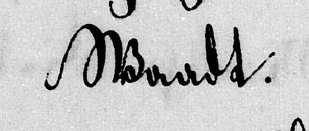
Waadt.
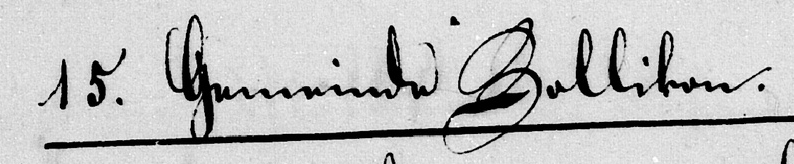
15. Gemeinde Zollikon.
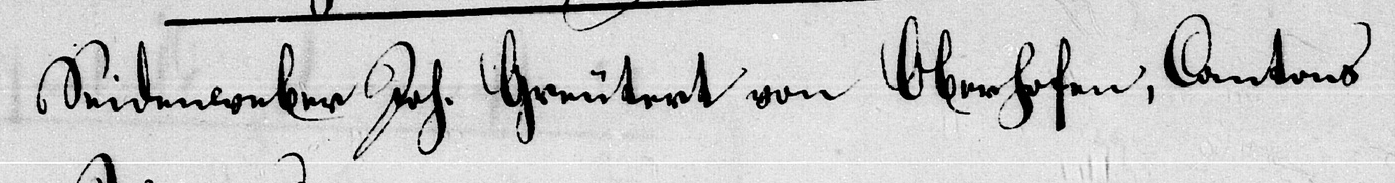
Seidenweber Joh. Greutert von Oberhofen, Cantons
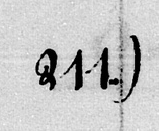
211.)
